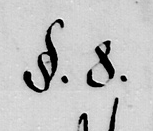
§. 8.
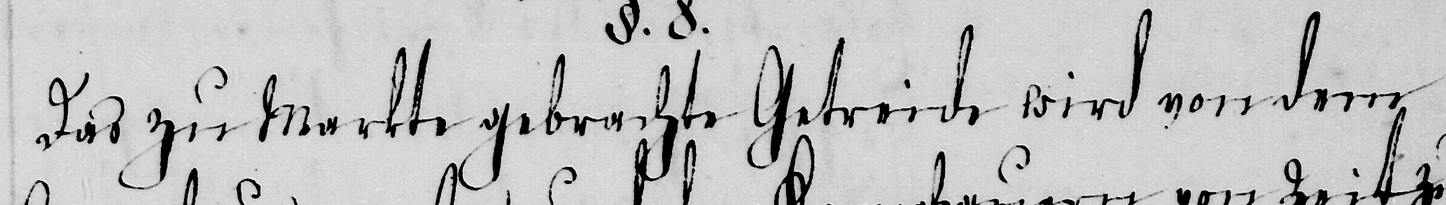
Das zu Markte gebrachte Getreide wird von dem
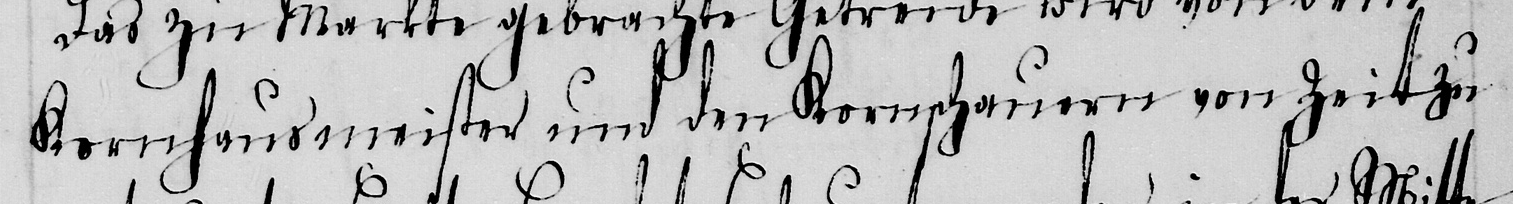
Kornhausmeister und den Kornschauern von Zeit zu
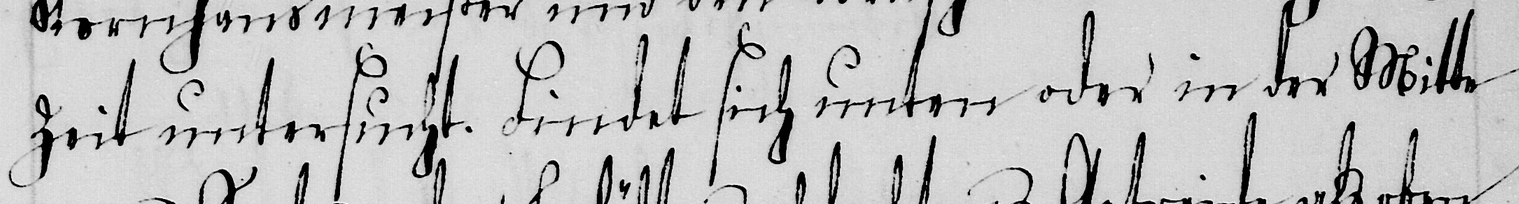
Zeit untersucht. Findet sich unten oder in der Mitte
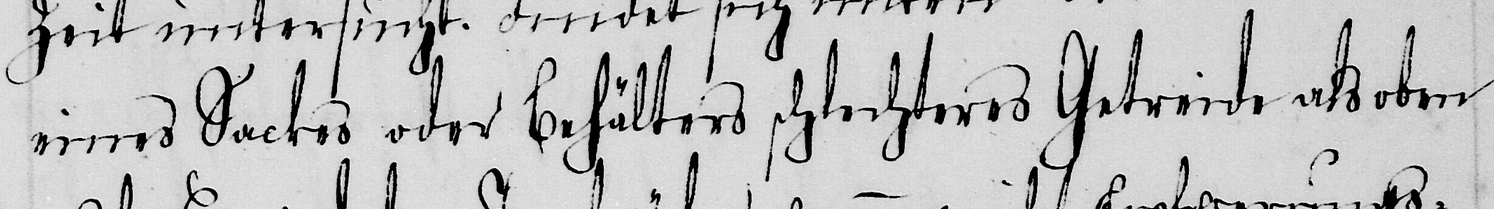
eines Sackes oder Behälters schlechteres Getreide als oben
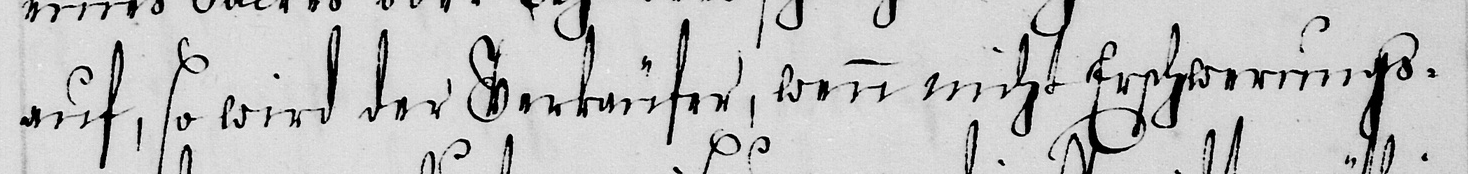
auf, so wird der Verkäufer, wenn nicht Erschwerungs¬
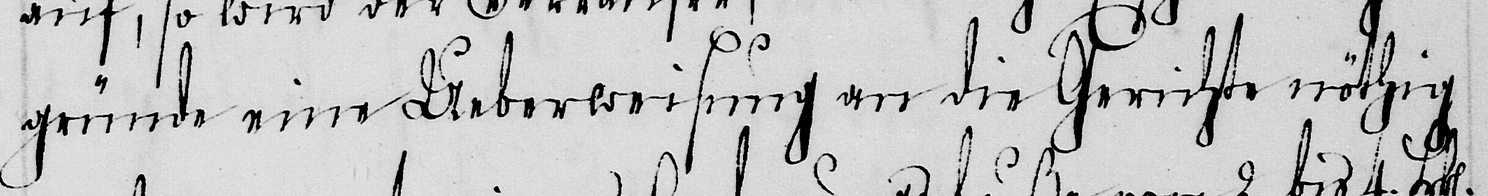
gründe eine Ueberweisung an die Gerichte nöthig
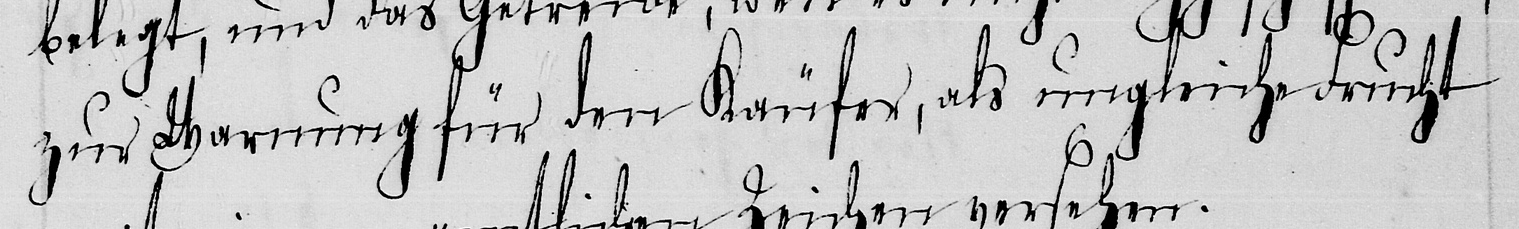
zur Warnung für den Käufer, als ungleiche Frucht
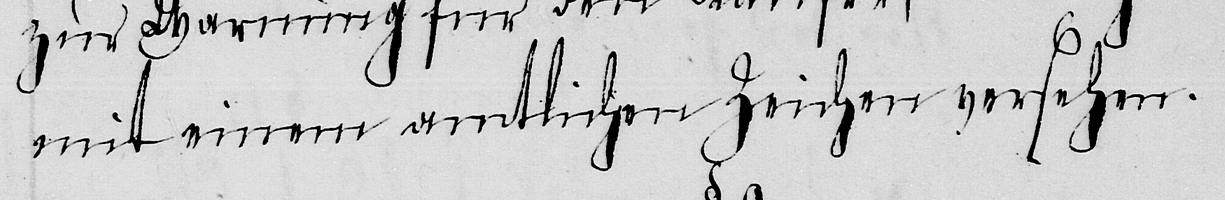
mit einem amtlichen Zeichen versehen.
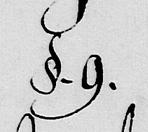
§. 9.
